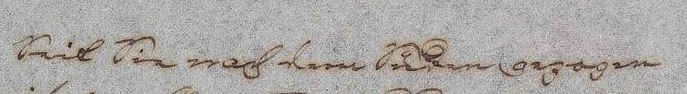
Seit Sie nach dem Süden gezogen
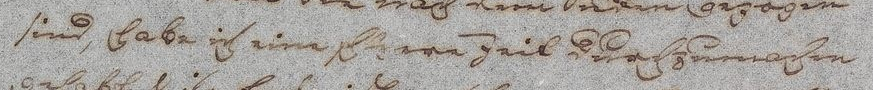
sind, habe ich eine schwere Zeit durchzumachen
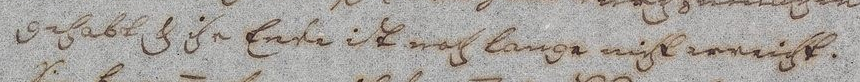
gehabt & ihr Ende ist noch lange nicht erreicht.
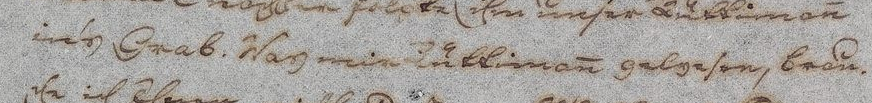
in's Grab. Was mir Rüttimann gewesen, brau-
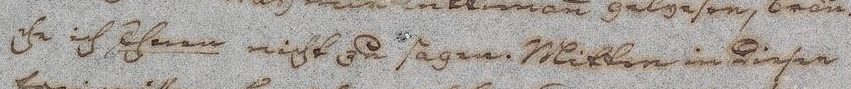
che ich Ihnen nicht zu sagen. Mitten in diesen
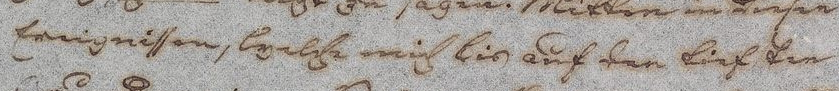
Ereignissen, welche mich bis auf den tiefsten
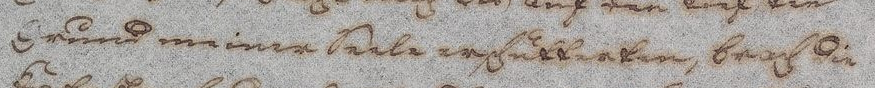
Grund meiner Seele erschütterten, brach die
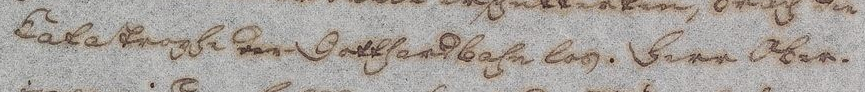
Katastrophe der Gotthardbahn los. Herr Ober-
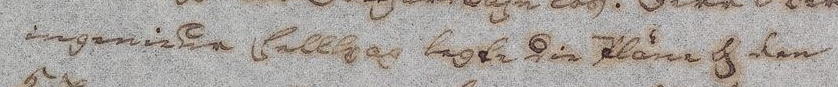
ingenieur Hellwag legte die Pläne & den
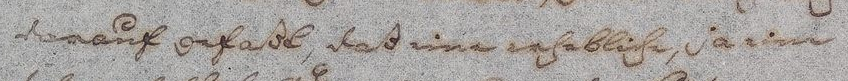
darauf gefaßt, daß eine erhebliche, ja eine
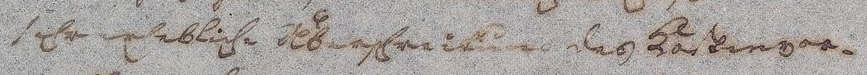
sehr erhebliche Überschreitung des Kostenvor-
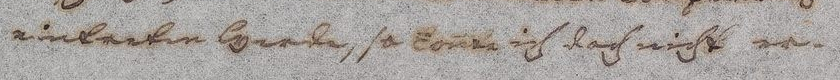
eintreten werde, so konnte ich doch nicht er-
